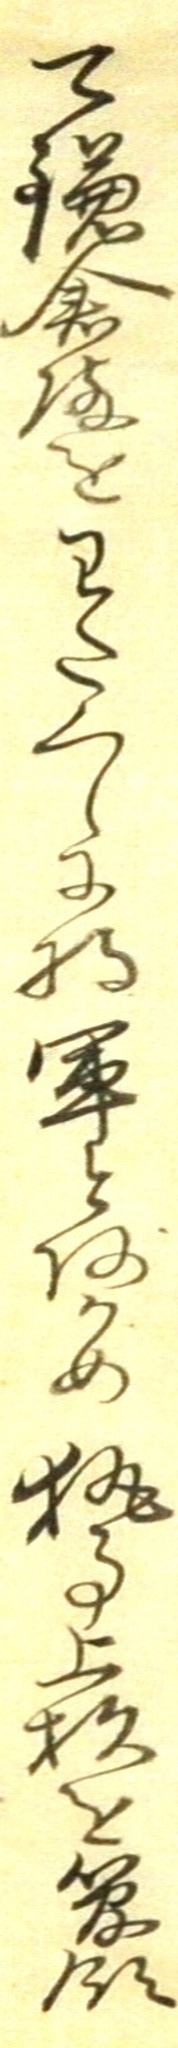て鎌倉殿をわたくしに将軍とあかめ執事上杉を管領
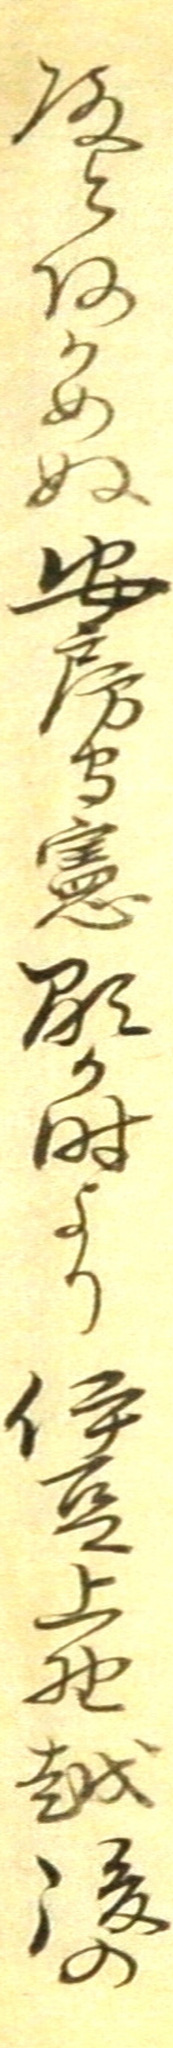殿とあかめぬ安房守憲顕か時より伊豆上野越後の

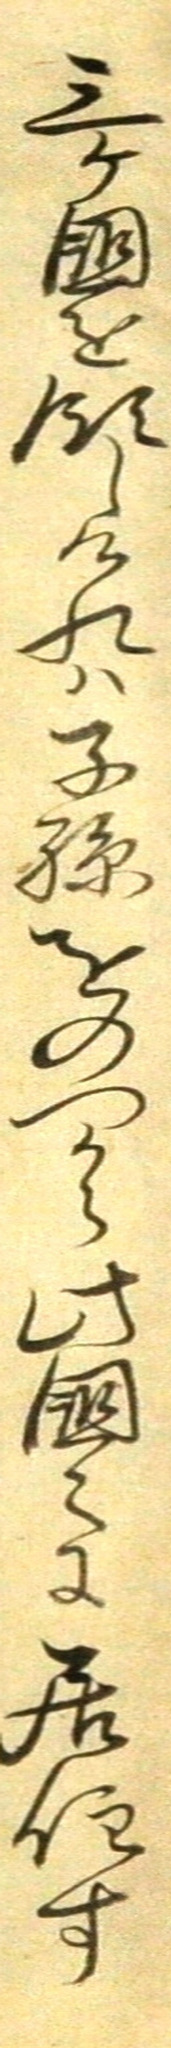三ヶ国を領しけれは子孫をのつから此国々に居住す
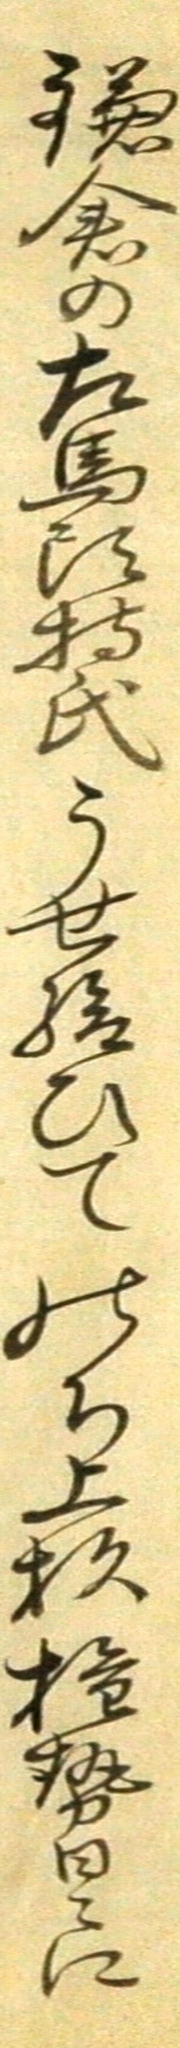鎌倉の左馬頭持氏うせ給ひてのち上杉権勢日々に
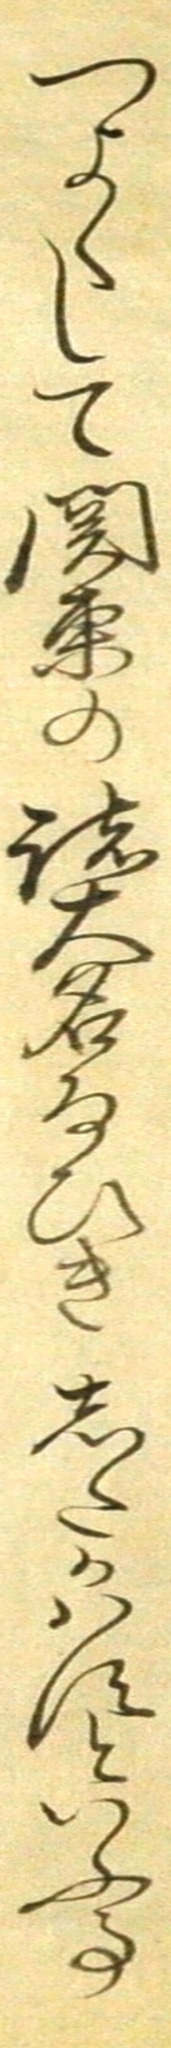つよくして関東の諸大名なひきしたかはすといふ事
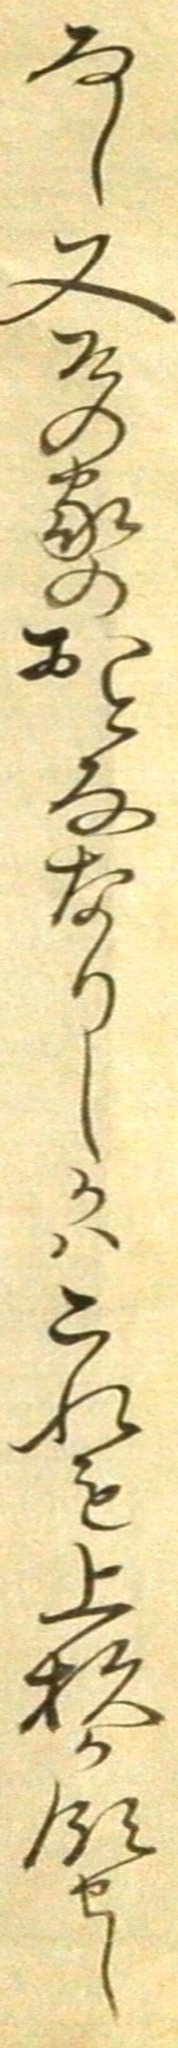なし又その家のおとななりしかはこれを上杉か領せし
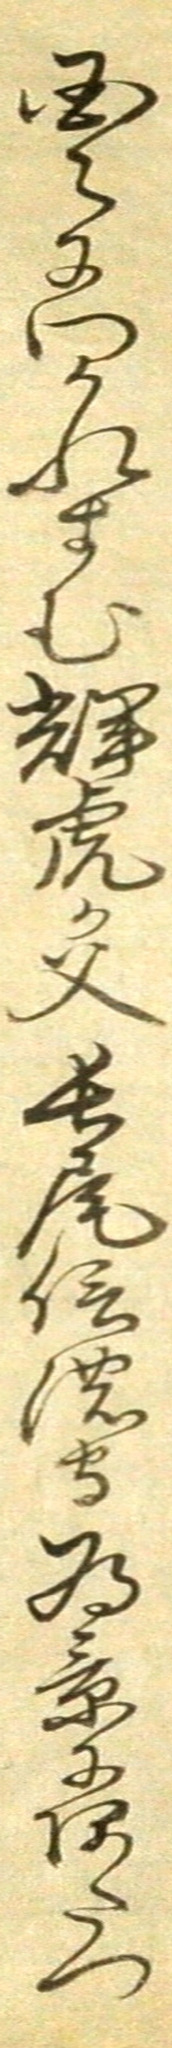国々にわかれすむ輝虎か父長尾信濃守為景にあたつ
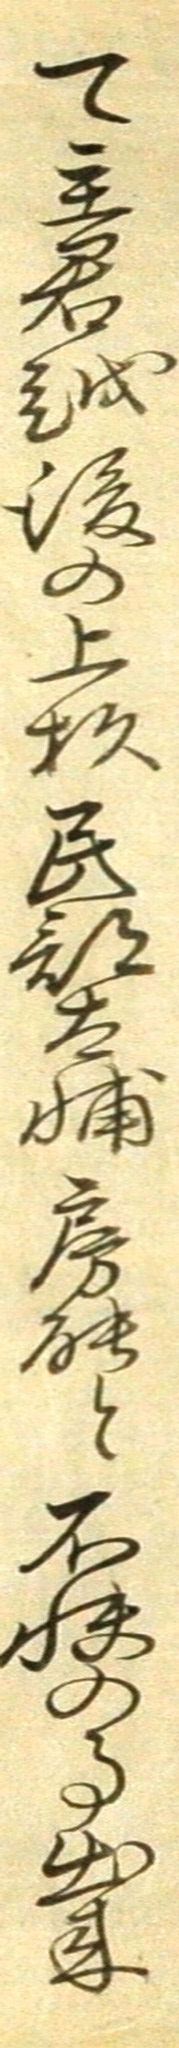て主君越後の上杉民部太輔房能と不快の事出来
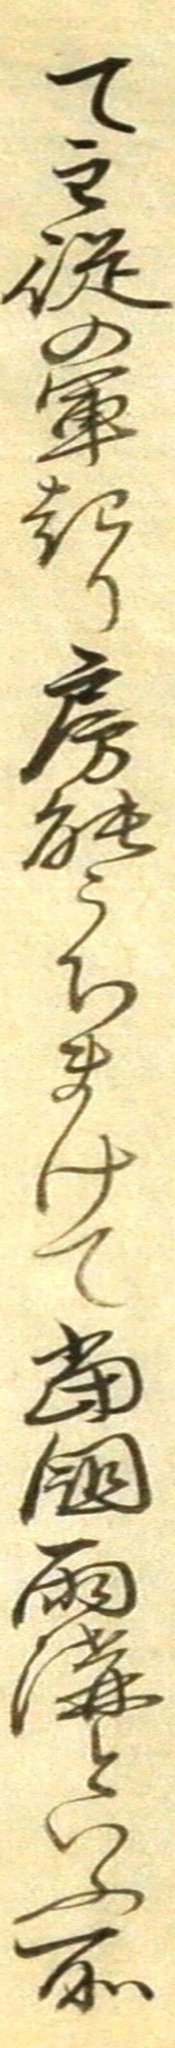て主従の軍起り房能うちまけて当国雨溝といふ所
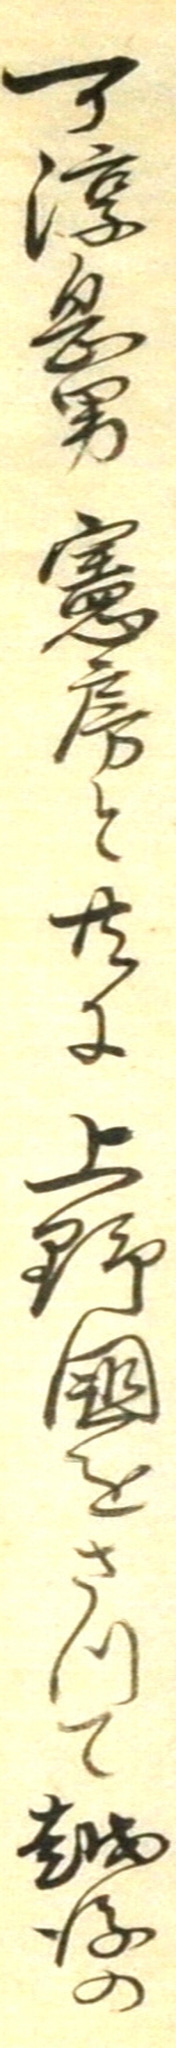可諄息男憲房と共に上野国をさつて越後の
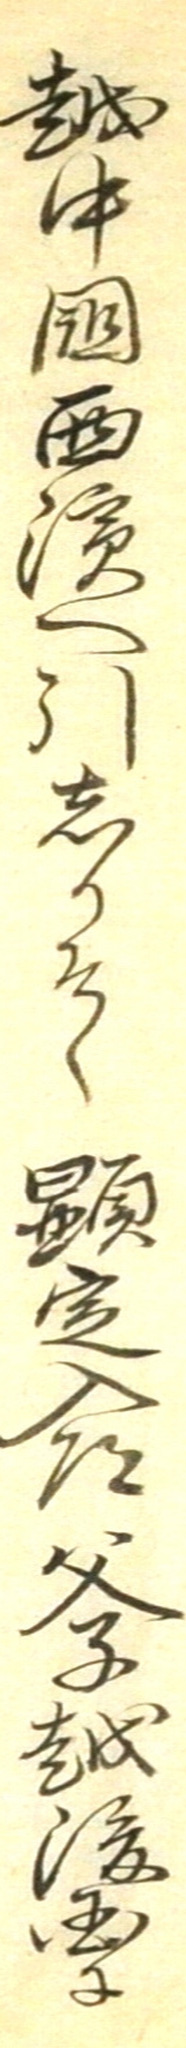越中国西浜へ引しりそく顕定入道父子越後国に
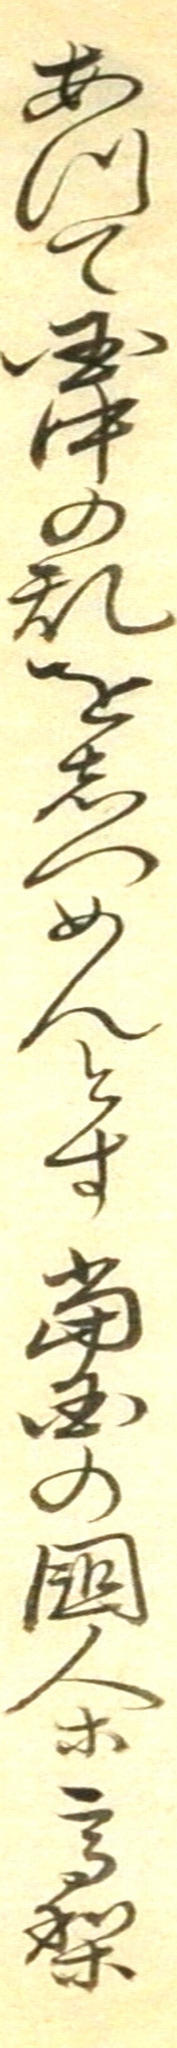あつて国中の乱をしつめんとす当国の国人等高梨
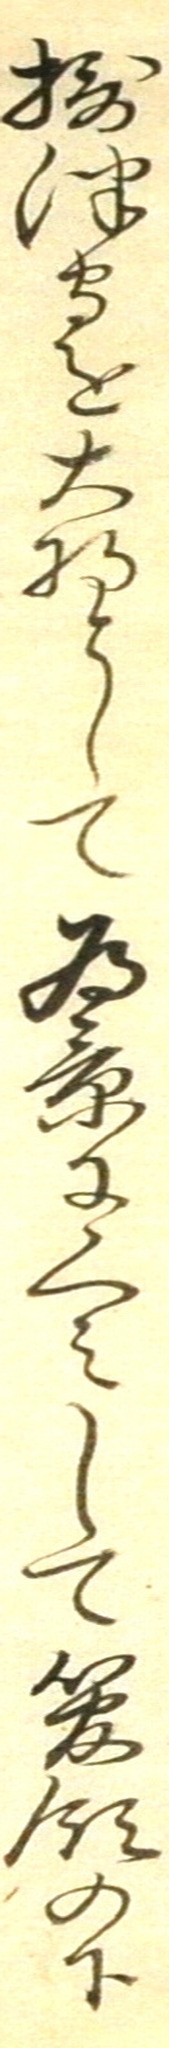摂津守を大将として為景にくみして管領の下
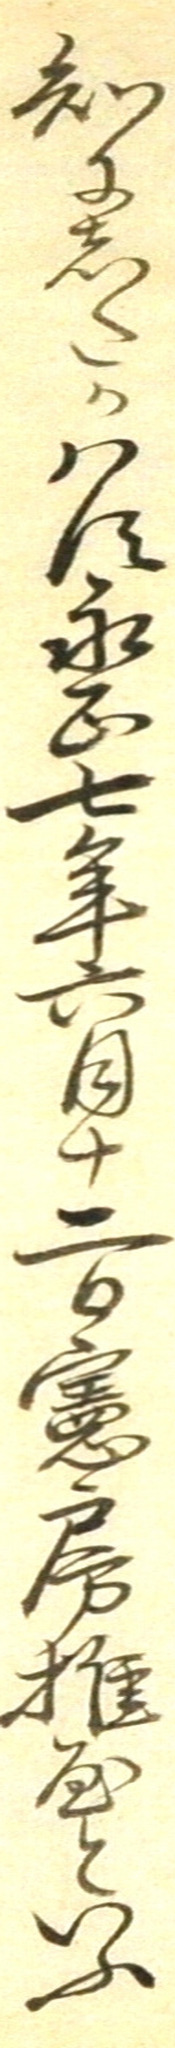知にしたかはす永正七年六月十二日憲房推屋といふ
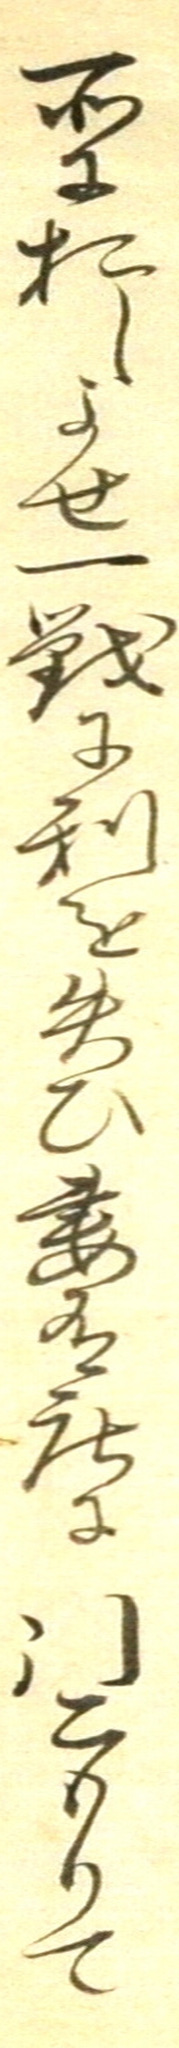所におしよせ一戦に利を失ひ妻有庄に引こもりて
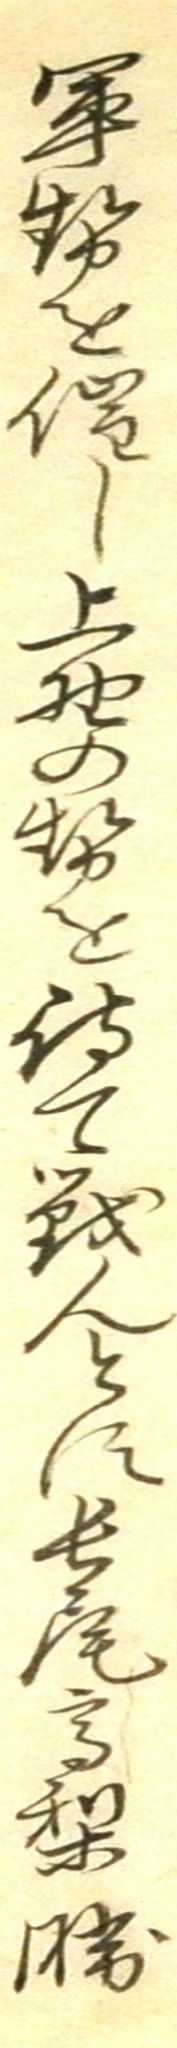軍勢を催し上野の勢を待て戦んとす長尾守梨勝
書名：藩翰譜（八・下）
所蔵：伊那市立高遠町図書館・合同会社AMANE
